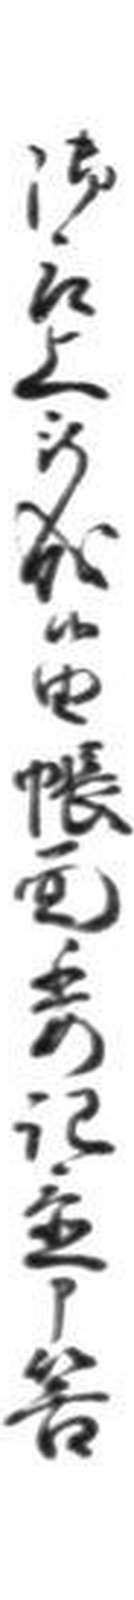御取上被成候由帳面委記置申筈
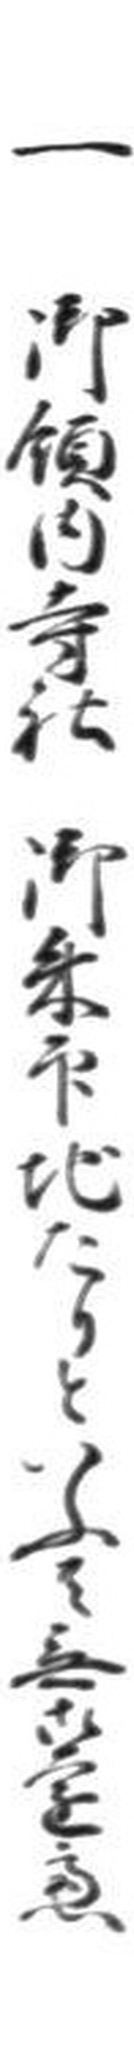一御領内寺社御朱印地たりといふ共無御遠慮
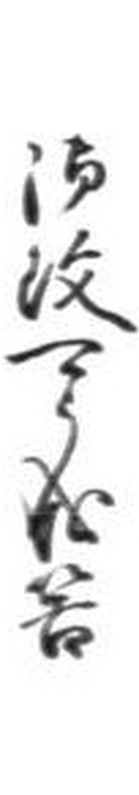御改可被成筈
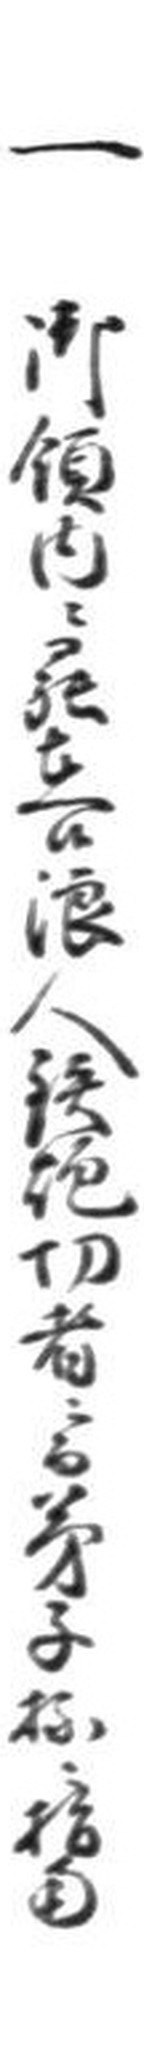一御領内ニ罷在候浪人鉄砲功者ニ而弟子抔ニ指南
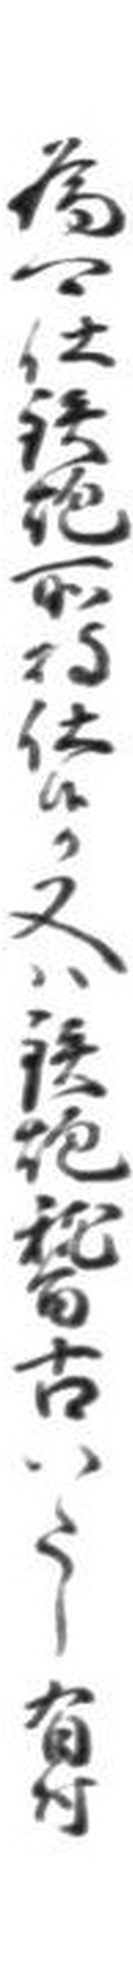為可仕鉄砲所持仕候か又ハ鉄砲稽古いたし有付
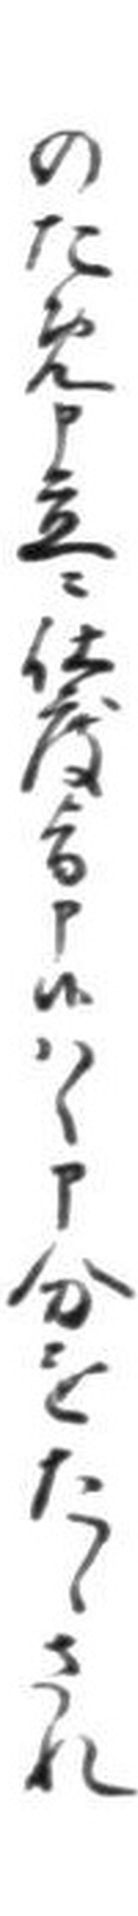のため申立ニ仕度旨申候ハヽ申分をたゝされ
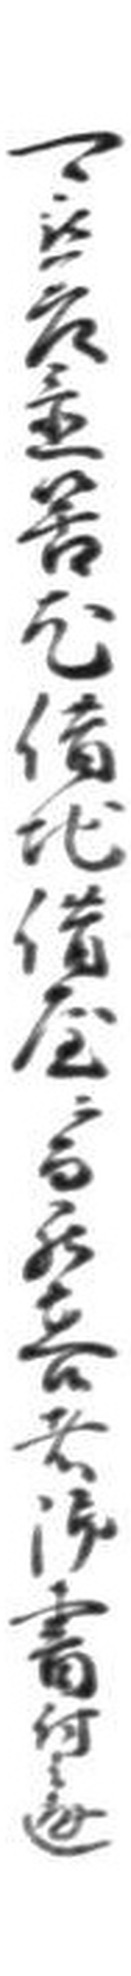可被差置筈尤借地借屋ニ而罷在候者御書付之通
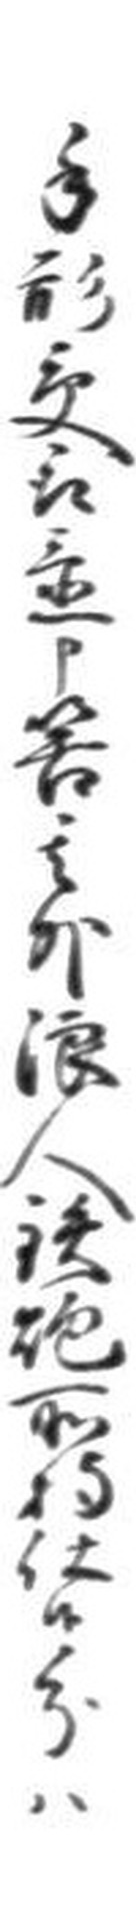手形受取置申筈其外浪人鉄砲所持仕候分ハ

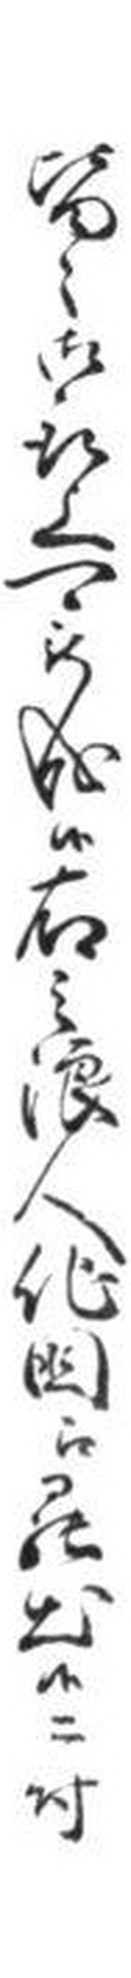皆々御取上可被成候右之浪人他国江罷出候ニ付
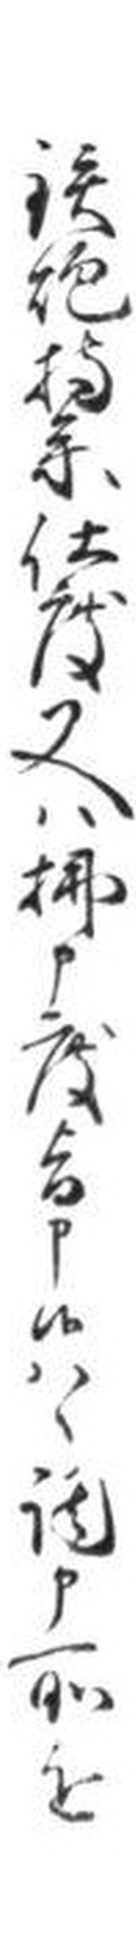鉄砲持参仕度又ハ払申度旨申候ハヽ調申所を
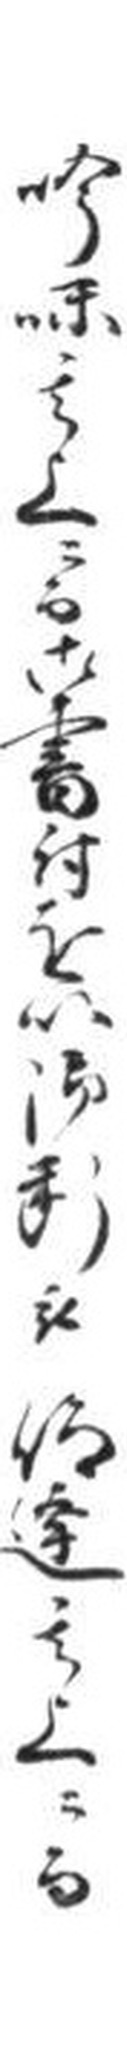吟味其上ニ而御書付を以御断被仰達其上ニ而
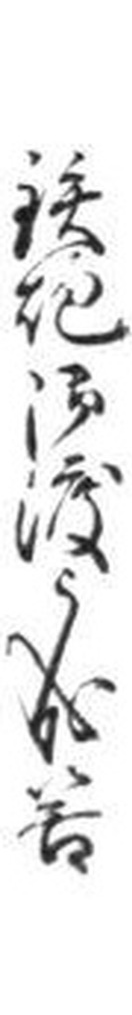鉄砲御渡被成筈
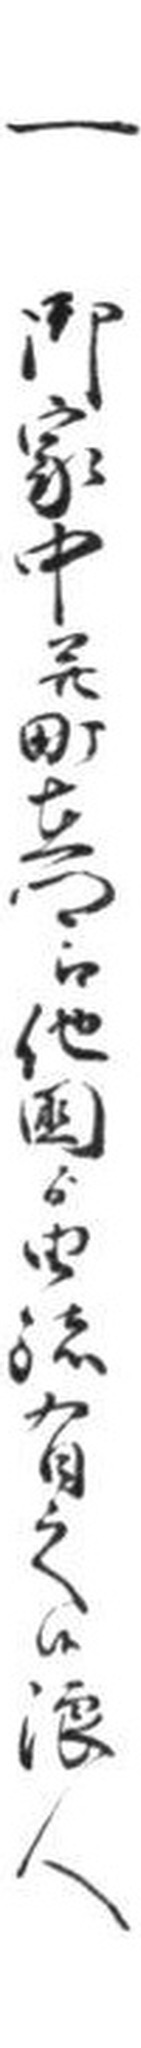一御家中并町在郷江他国ゟ由緒有之候浪人
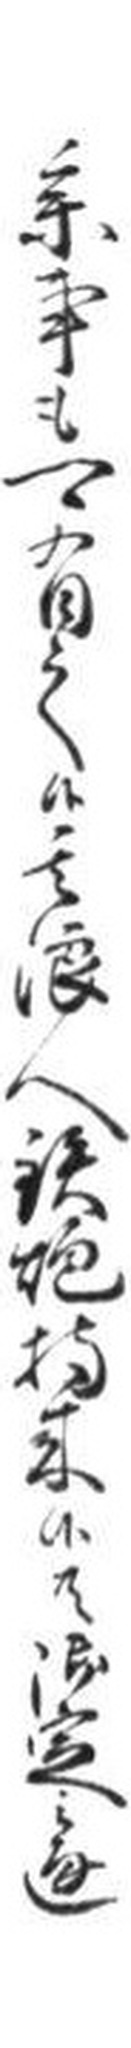参事も可有之候其浪人鉄砲持来候共御定之通
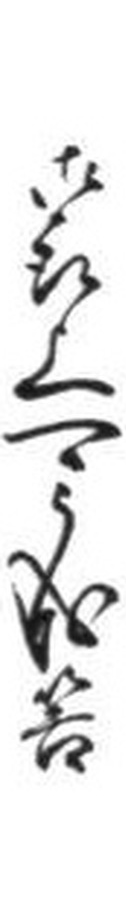御取上可被成筈
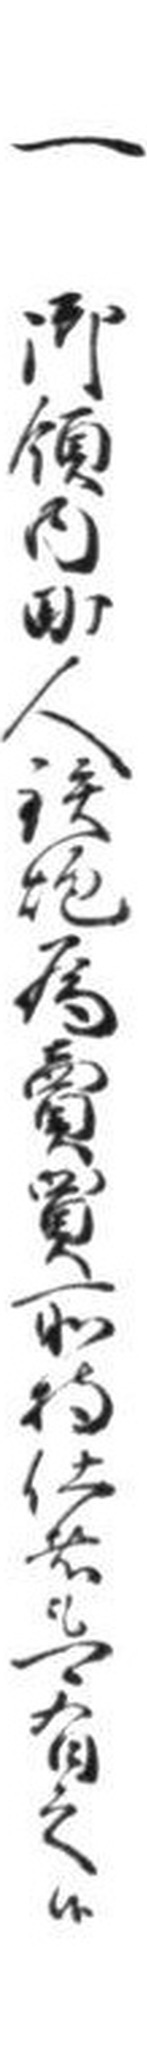一御領内町人鉄砲為売買所持仕者も可有之候
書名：家譜 十七 吉品公 従元禄元年到同二年
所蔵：福井県文書館 Fukui Prefectural Archives
